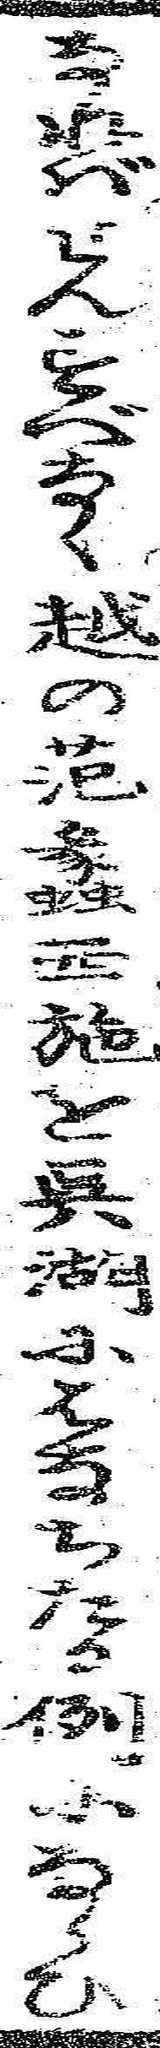なれば。せんすべなく。越の范蠡西施を呉湖にはなちたる例にならひ。
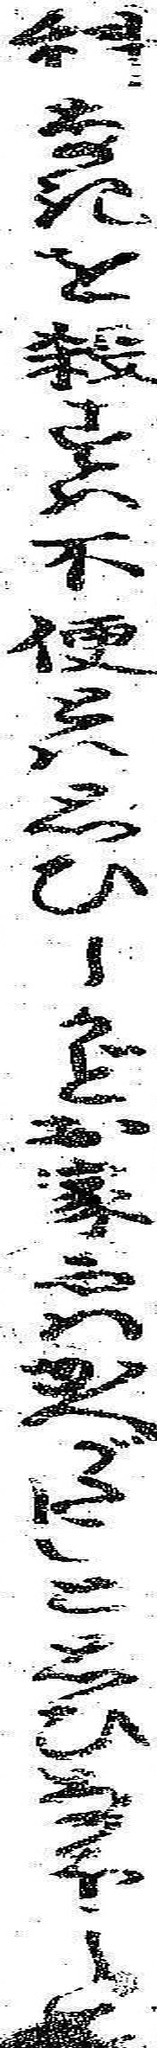科なきを殺すは不便とは思ひしかど。お家にはかへがたしと思ひなほして。
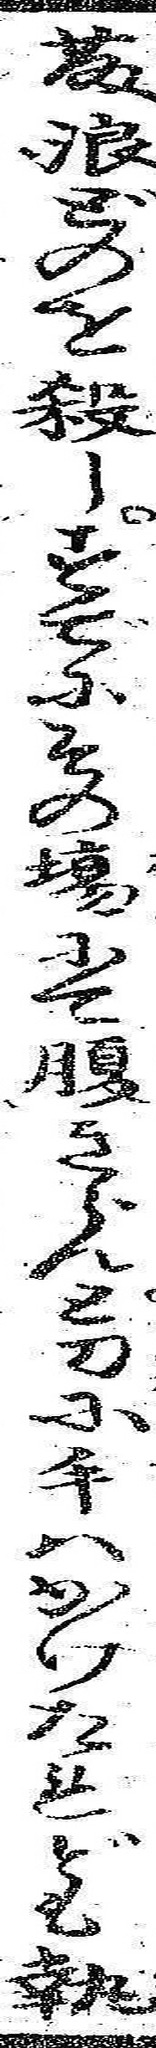藤浪どのを殺し。すでにその場にて腹きらんと。刀に手はかけたれども。執
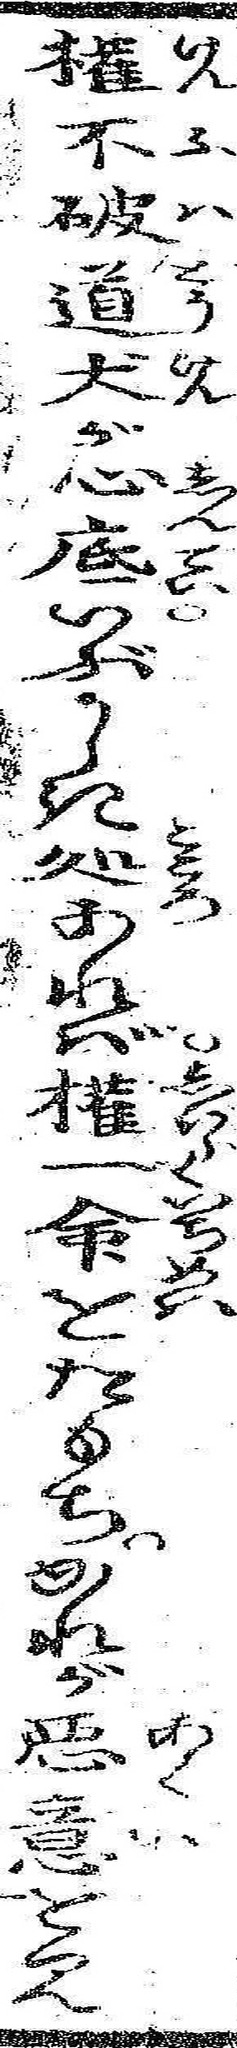権不破道犬が心底。いぶかしき処あれば。権一命をたもち。かれが悪意を見
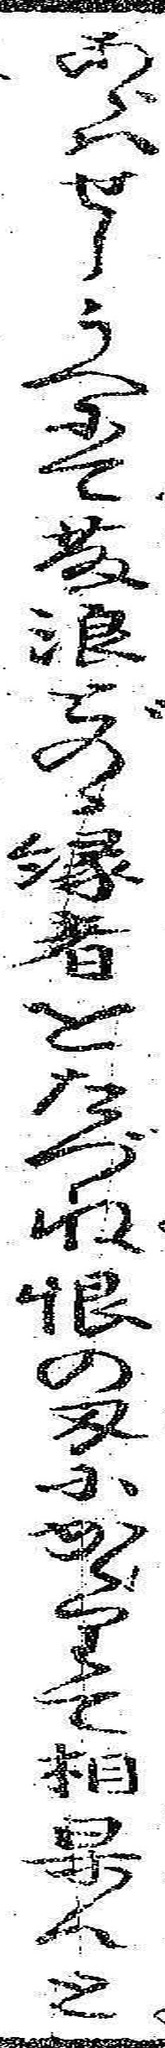あらはせしうへにて。藤浪どのゝ縁者をたづね。恨の刃にかゝりて相果んと。
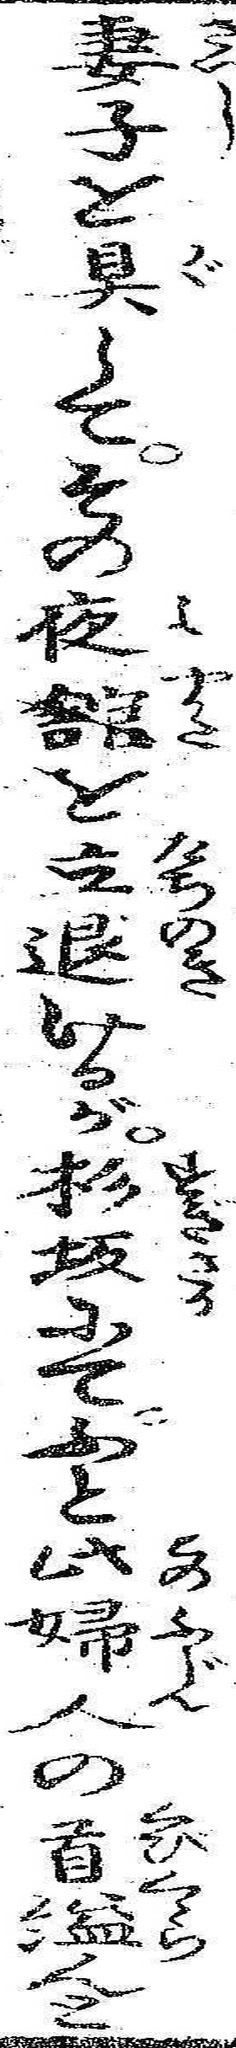妻子を具して。その夜館を立退けるが。杉坂にて。ふと此婦人の首縊んと
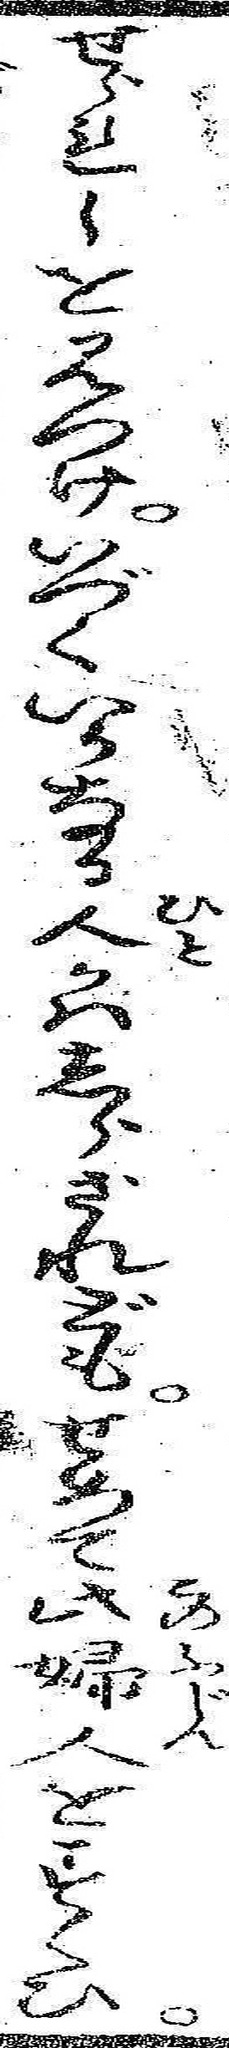せられしを見つけ。いづくいかなる人かはしらざれども。せめて此婦人をすくひ。
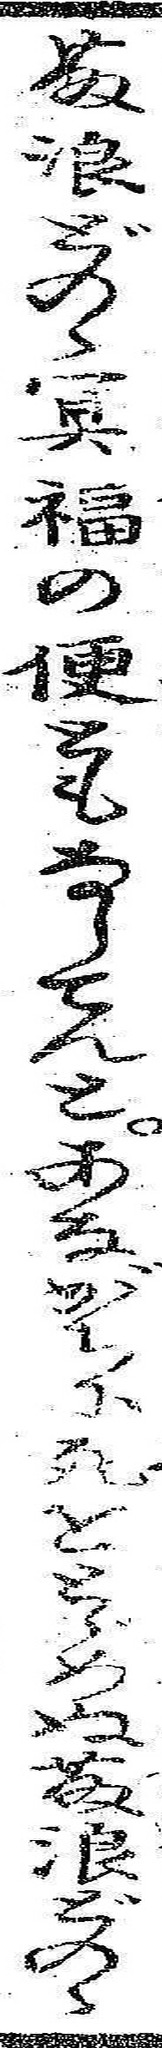藤浪どのゝ冥福の便ともなしてんと。あながちに死をとゞめぬ。藤浪どのゝ
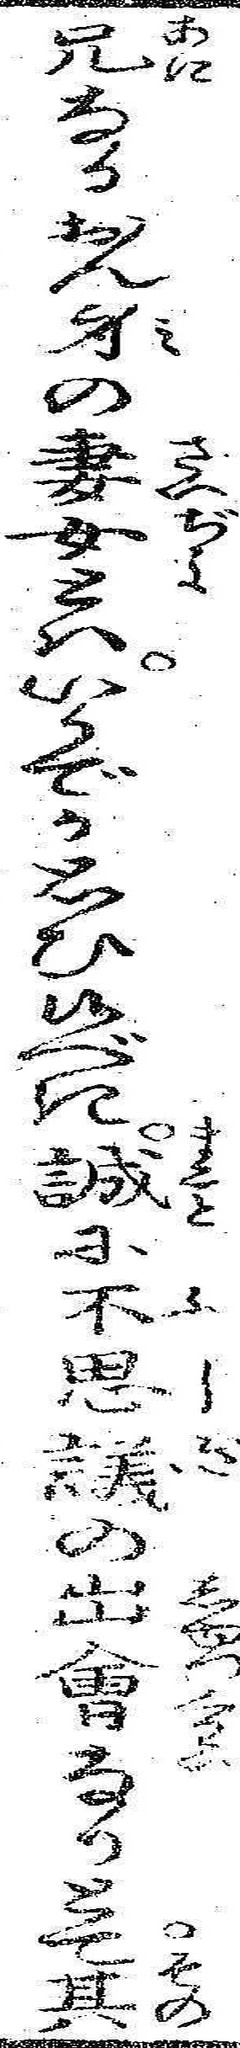兄なるおん身の妻女とは。いかでか思ひ候べき。誠に不思議の出会なりとて。其
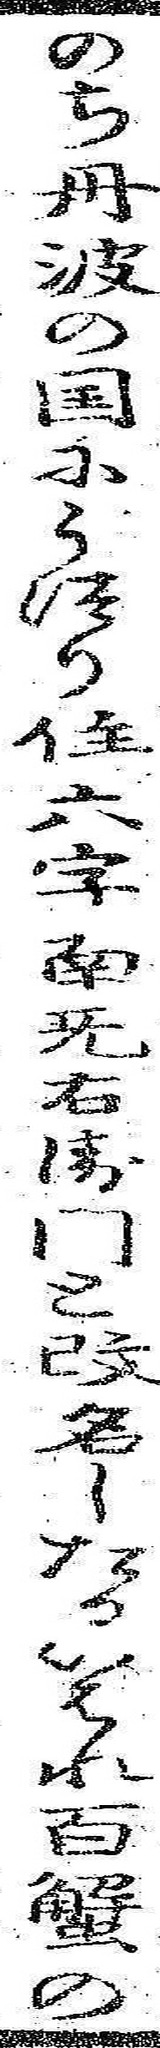のち丹波の国にうつり住六字南無右衛門と改名したるいはれ。百蟹の
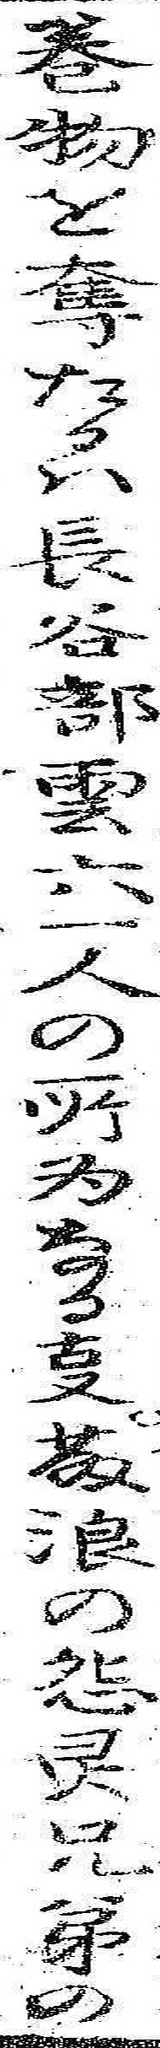巻物を奪たるは。長谷部雲六一人の所為なる事。藤浪の怨霊兄弟の
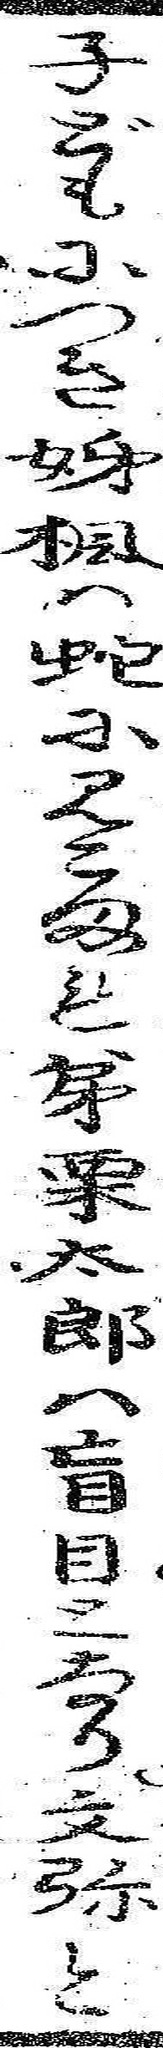子どもにつき。姉楓は蛇に見こまれ。弟栗太郎は盲目となり。文弥と
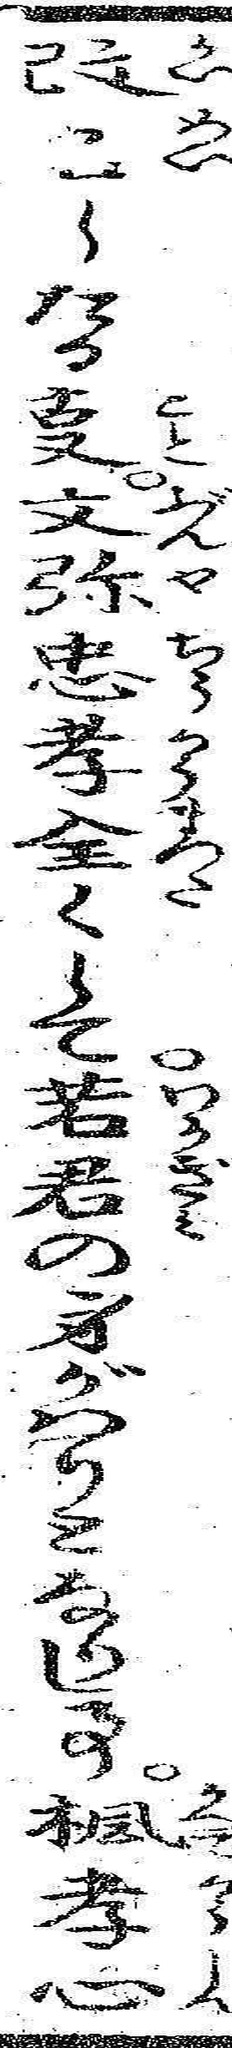改名したる事。文弥忠孝全くして。若君の身がはりとなりし事。楓孝心

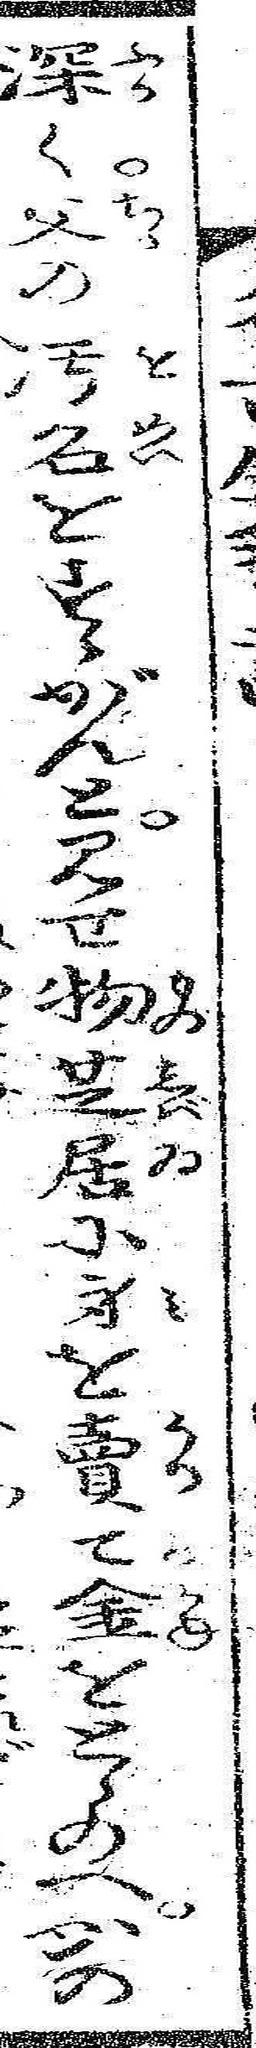深く。父の汚名をすゝがんと。見せ物芝居に身を売て。金をとゝのへ。かの
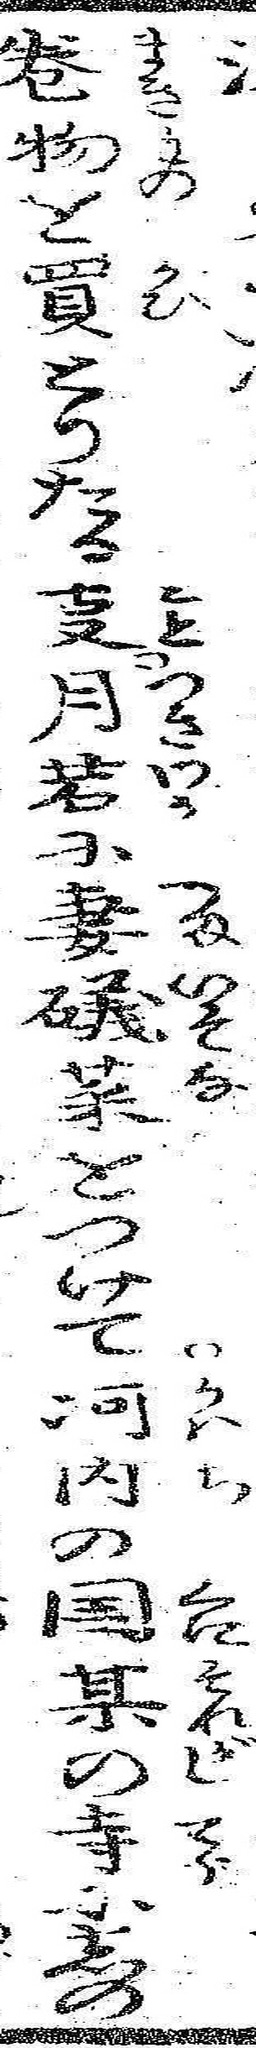巻物を買とりたる事。月若に妻礒菜をつけて。河内の国某の寺にしの
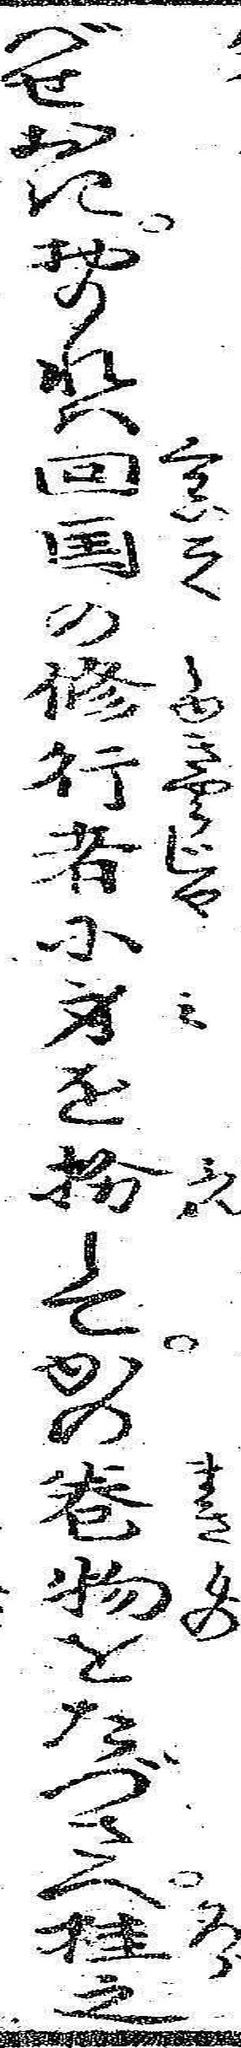ばせおき。おのれは回国の修行者に身を扮して。かの巻物をたづさへ。桂之
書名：昔話稲妻表紙
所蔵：国文学研究資料館
